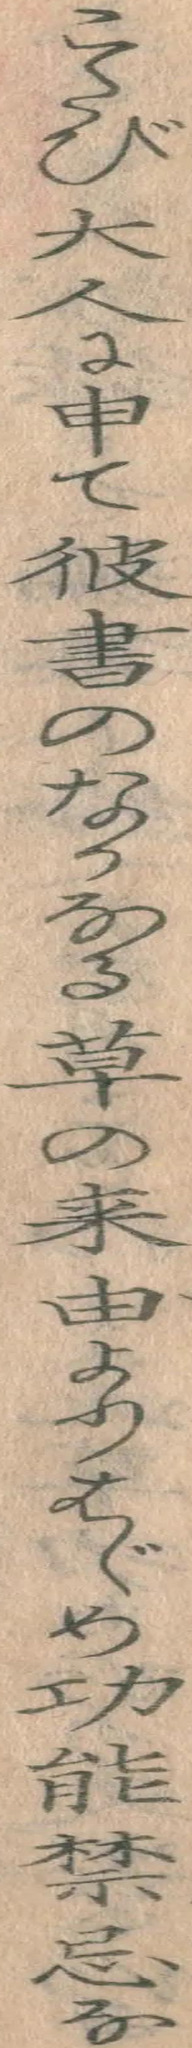こたび大人に申て彼書のなかなる草の来由よりはじめ功能禁忌な
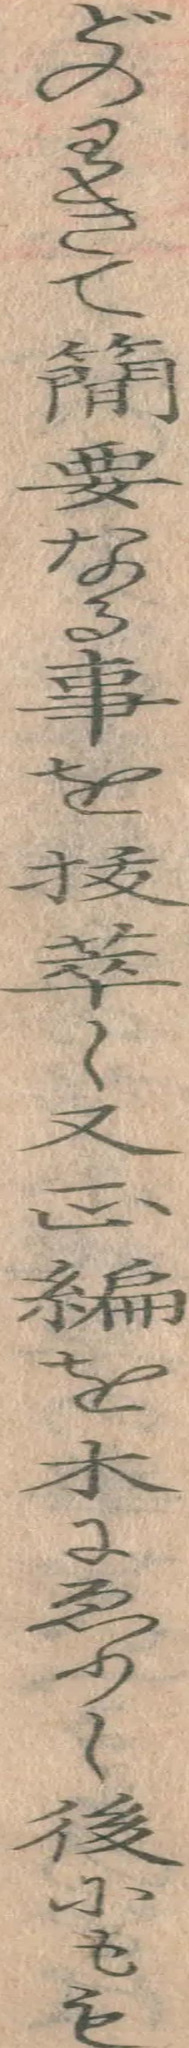どのわきて簡要なる事を抜萃し又正編を木にゑりし後にもも
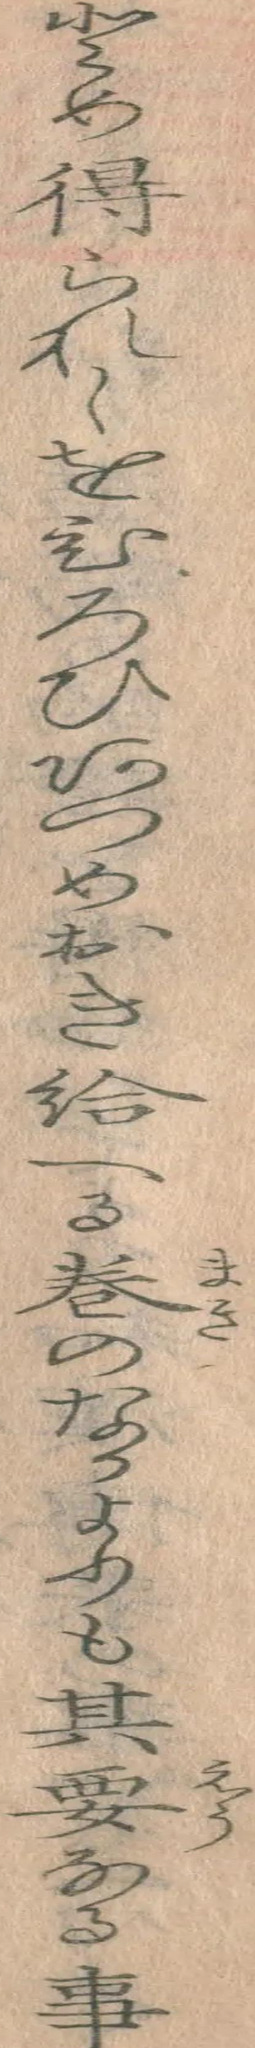とめ得られしをひろひあつめおき給へる巻のなかよりも其要なる事
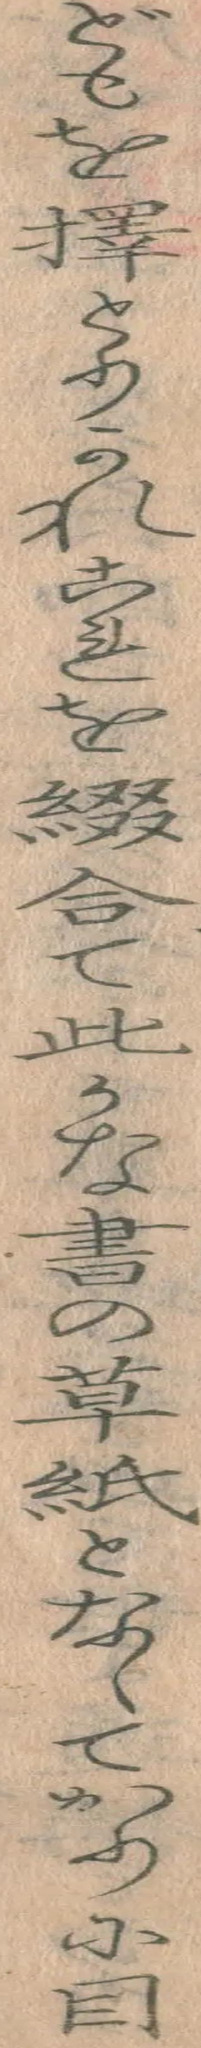どもを択とりかれこれを綴合て此かな書の草紙となしてかりに目
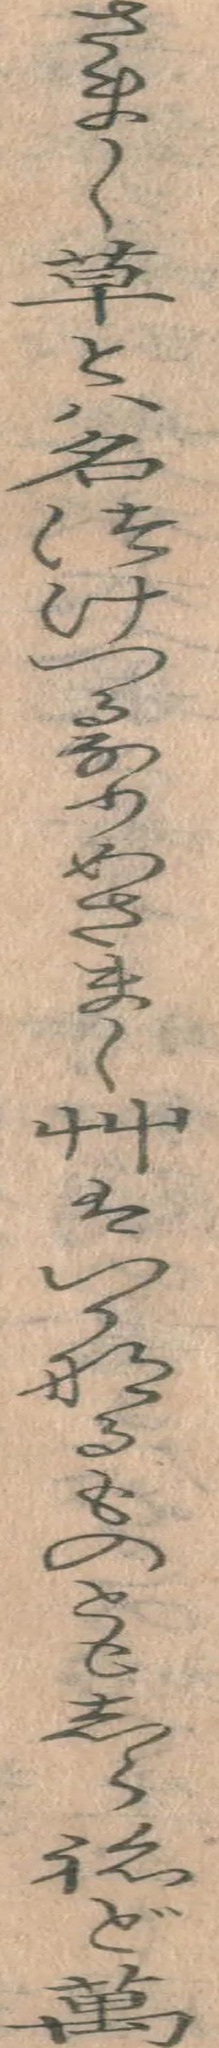さまし草とは名つけつるなりめさまし艸はいかなるものともしらねど万
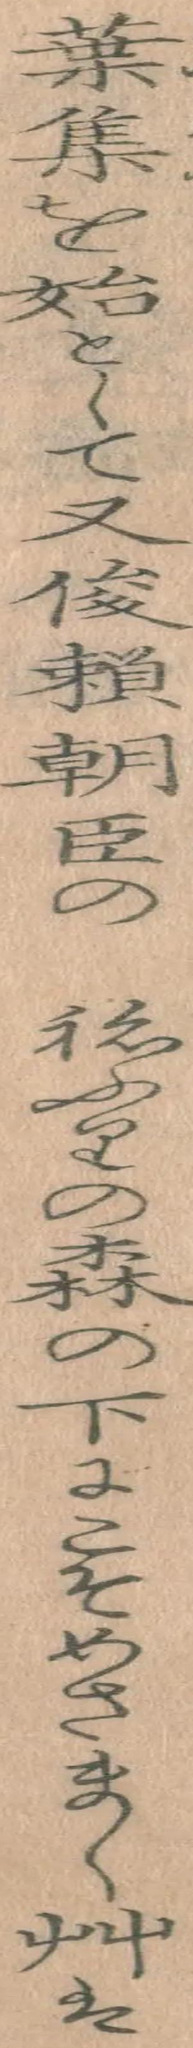葉集を始として又俊頼朝臣のねふりの森の下にこそめさまし艸は
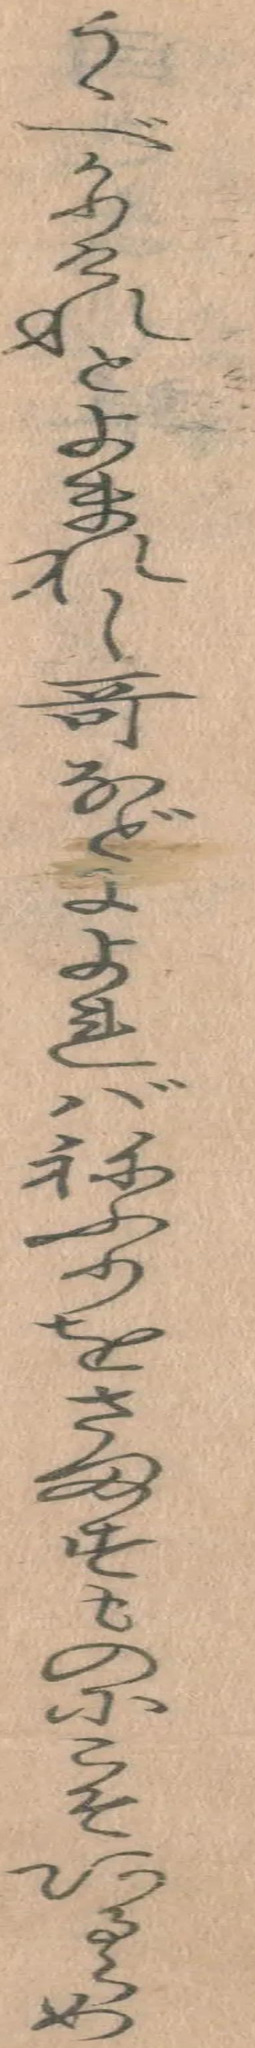うゝべかりけれとよまれし歌などによればねふりをさますものにこそあるらめ
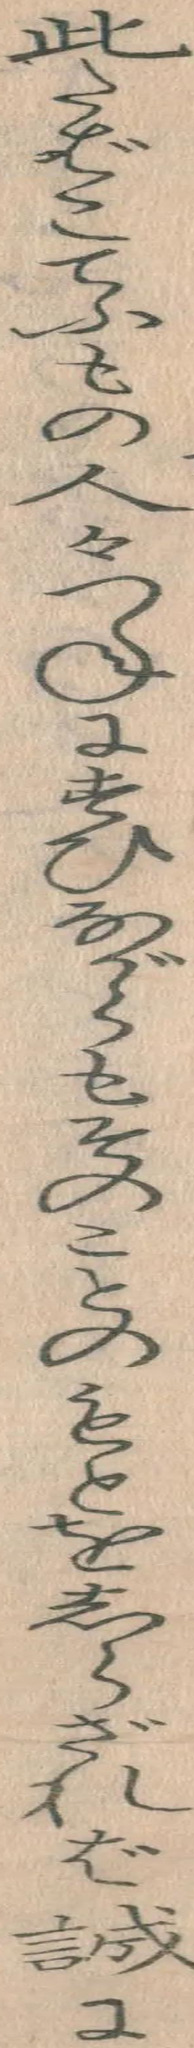此たばこてふもの人々つねにすいながらもそのことのもとをしらざれば誠に
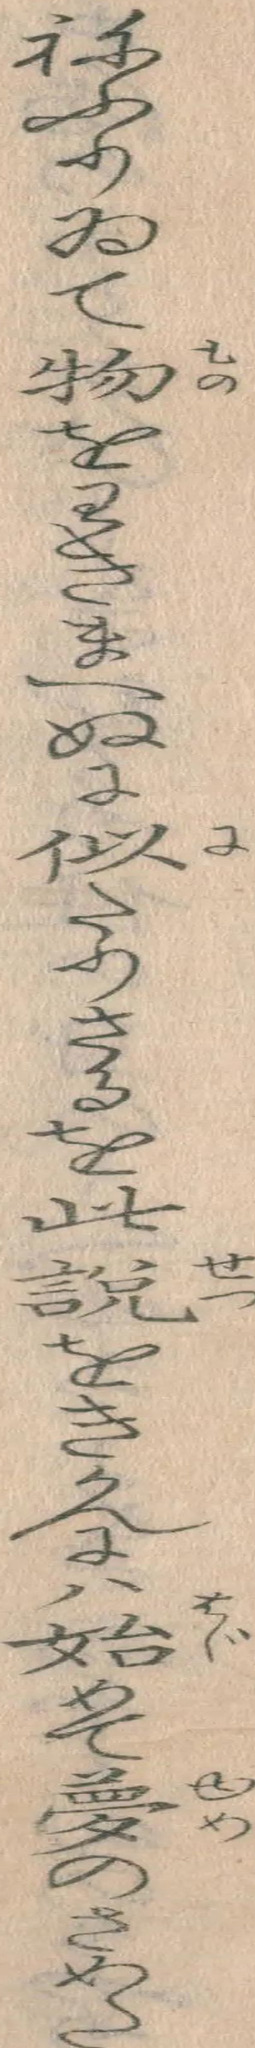ねふりゐて物をわきまへぬに似たりさるを此説をきかんには始めて夢のさめた
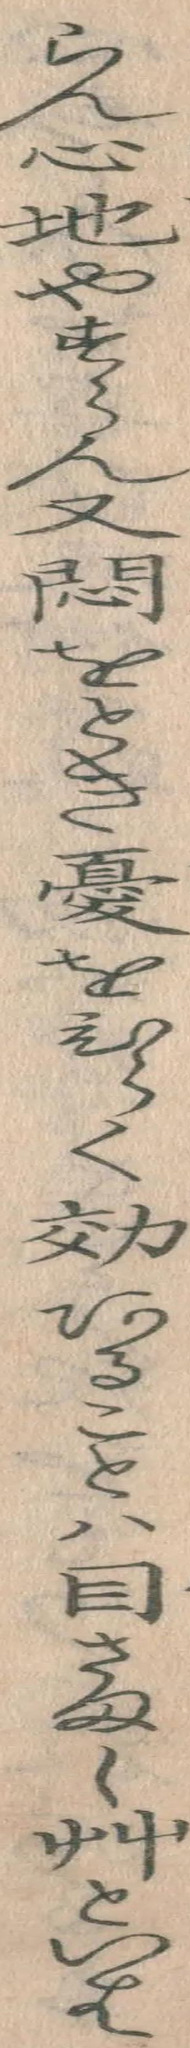らん心地やすらん又悶をとき憂をひらく効あることは目さまし艸といは
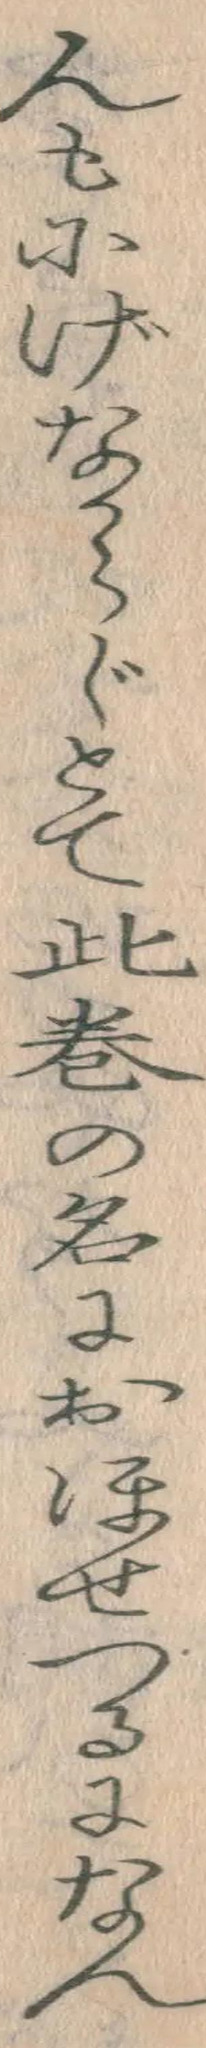んもにげなからじとて此巻の名におほせつるになん
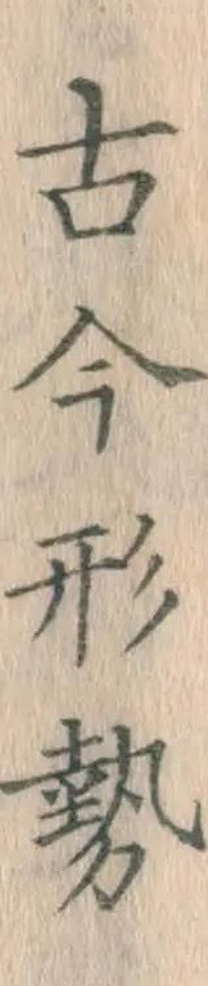古今形勢
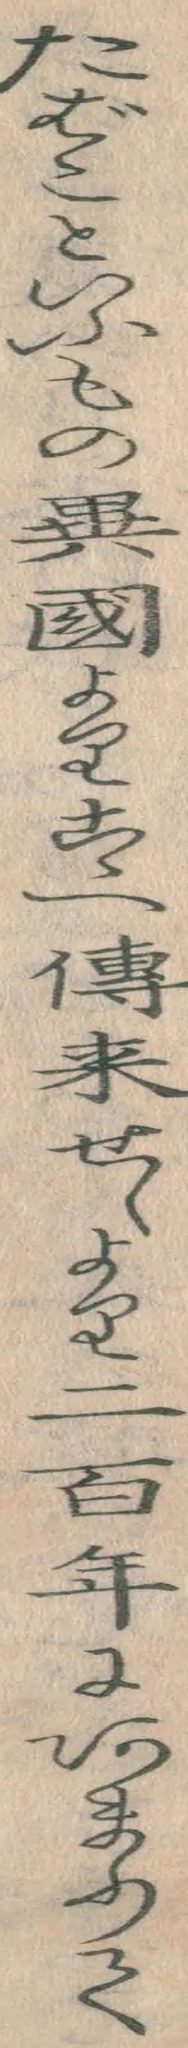たばこといふもの異国よりこゝへ伝来せしより二百年にあまりて
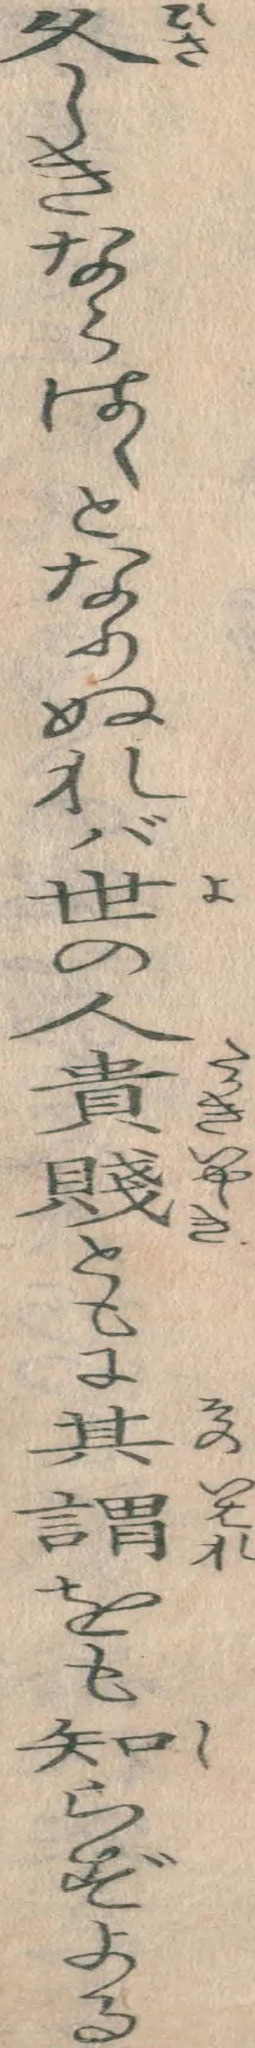久しきならはしとなりぬれば世の人貴賤ともに其謂をも知らずよる
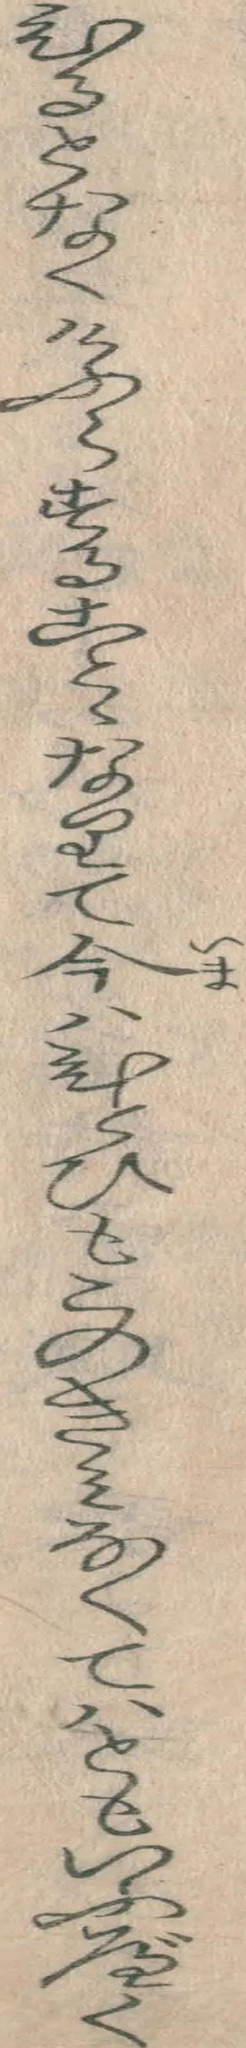ひるとなくけふらすることゝなりて今はひとひもこのきみなくてはともいふべく
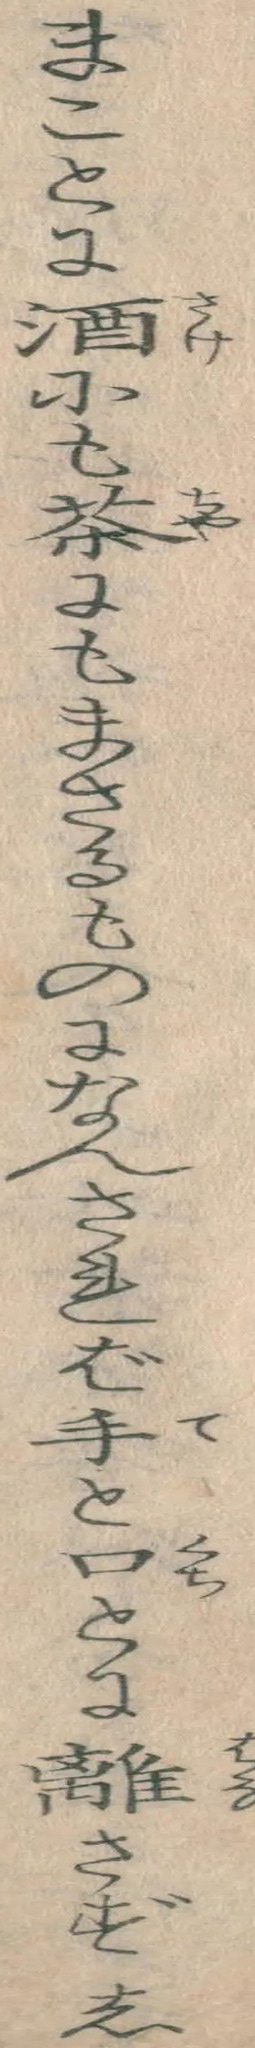まことに酒にも茶にもまさるものになんされば手と口とに離さずし
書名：目さまし草
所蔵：国立国会図書館 National Diet Library, JAPAN
